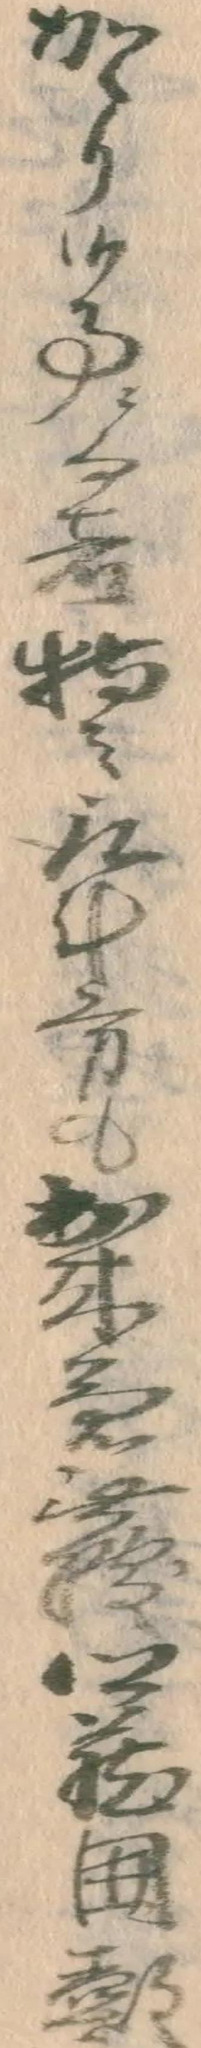かゝり候事ニ奇特之取斗有之も出来兼無拠郷蔵囲穀
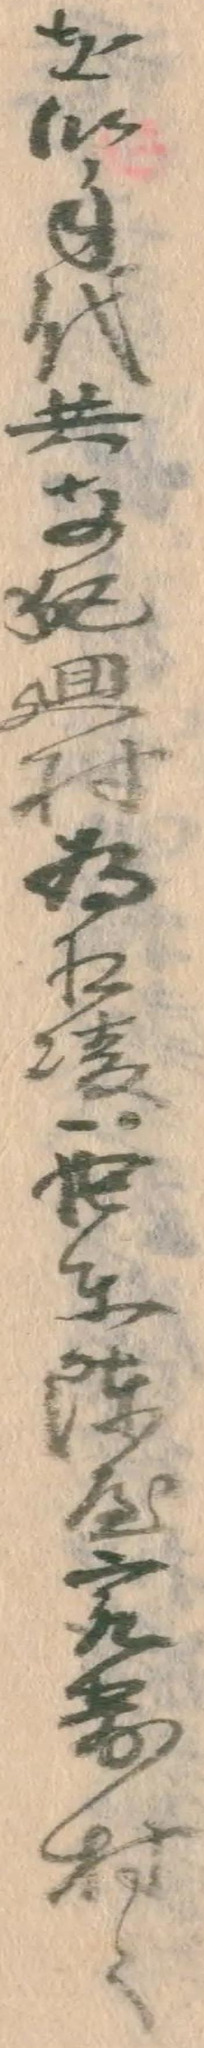を以手代共支配廻村為相凌罷在陣屋最寄村々
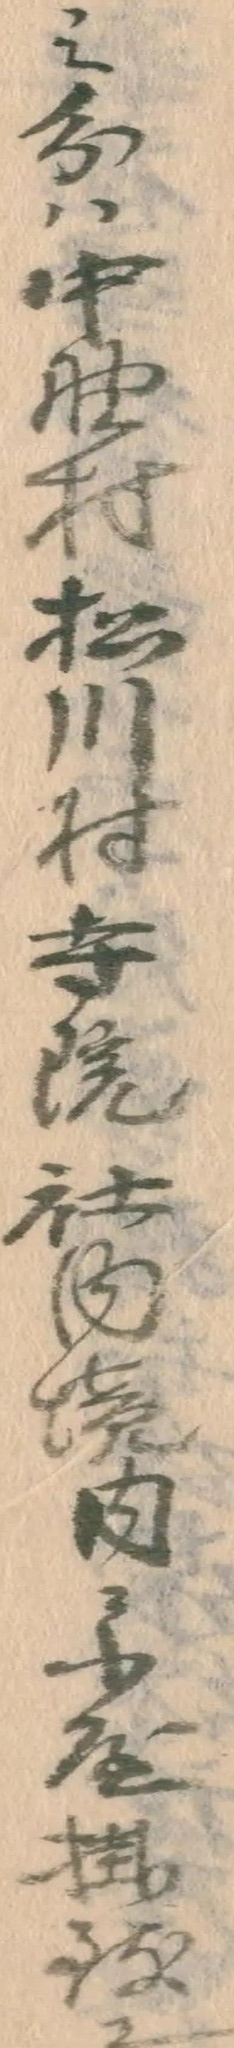之分ハ中野村松川村寺院社内境内二小屋掛致シ
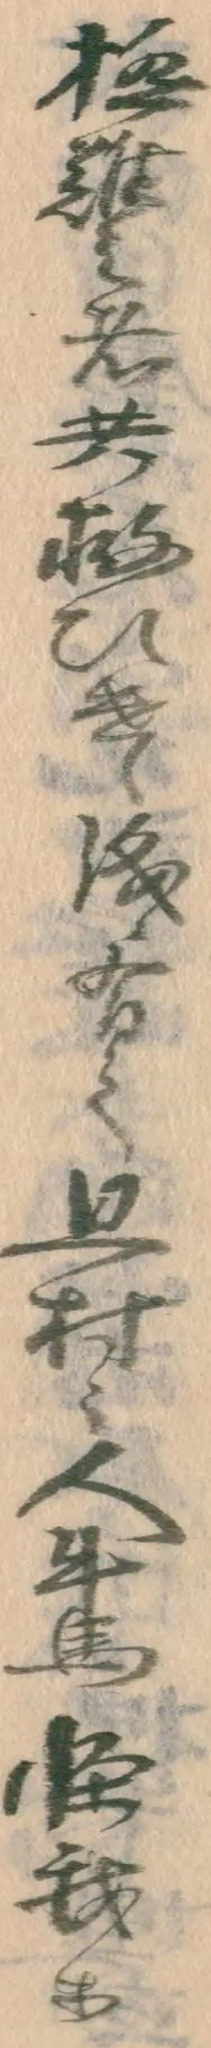極難之者共救ひ遣候儀ニ有之且村々人牛馬死亡怪我等
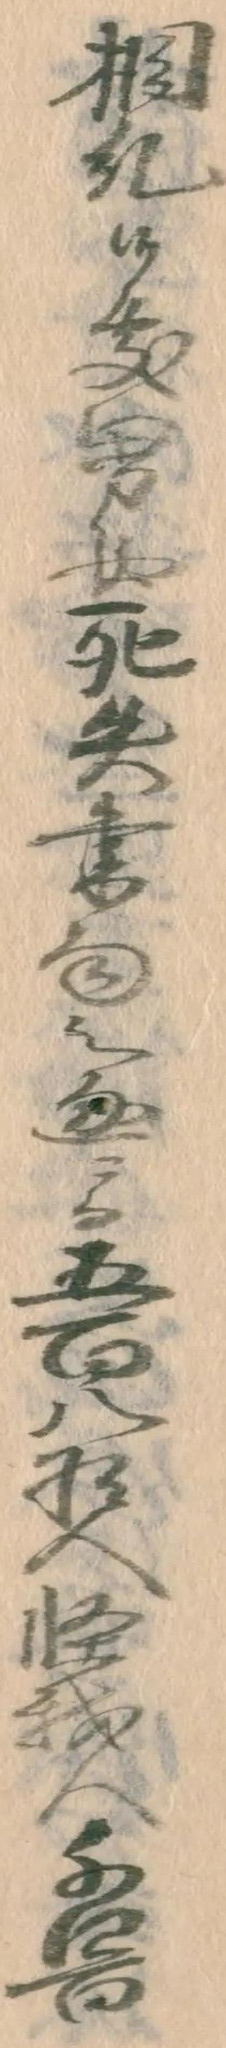相糺候処男女死失書面之通りニ而五百八拾人怪我人千四百
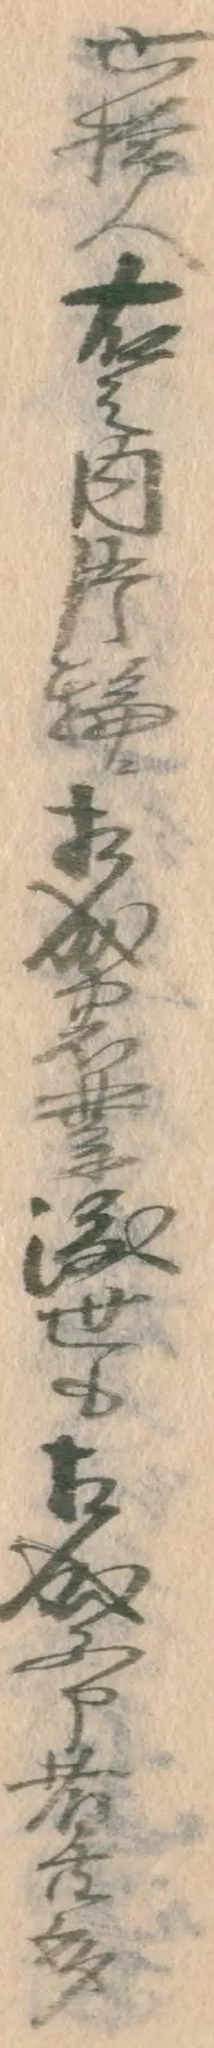六拾人右之内片輪ニ相成農業渡世も相成不申者共多
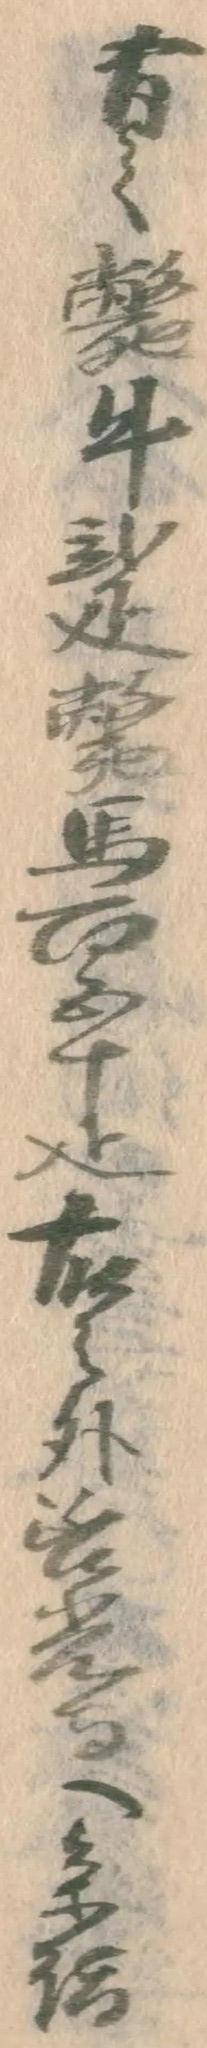有之斃牛弐疋斃馬百五拾疋右之外善光寺へ参詣
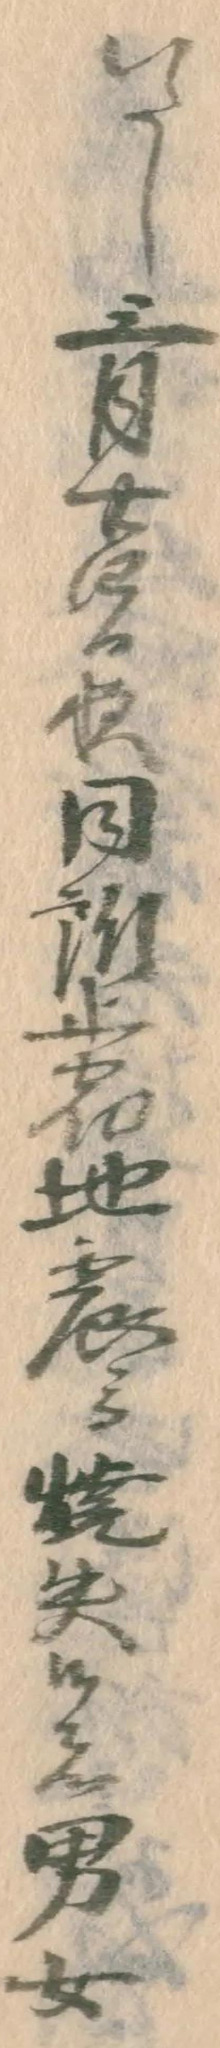いたし三月廿四日夜同所止宿地震ニ而焼失候者男女
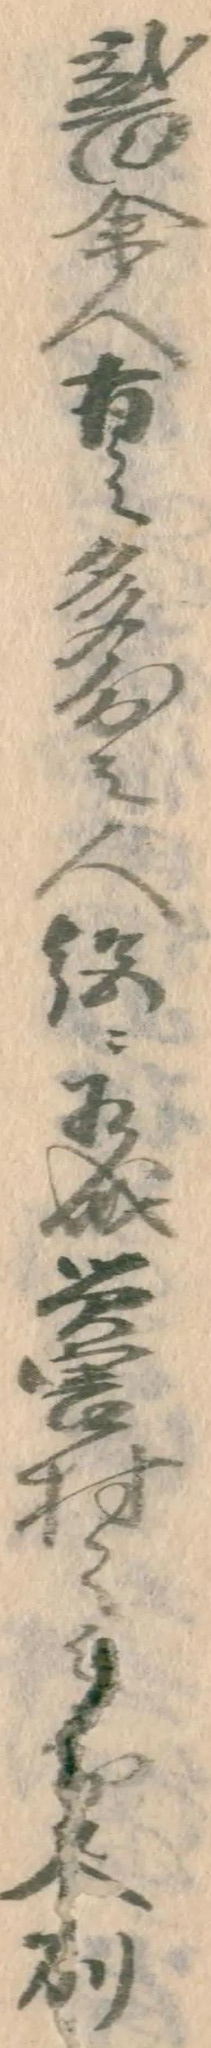弐百余人有之多之分之人絶ニ相成災害村々之分人別
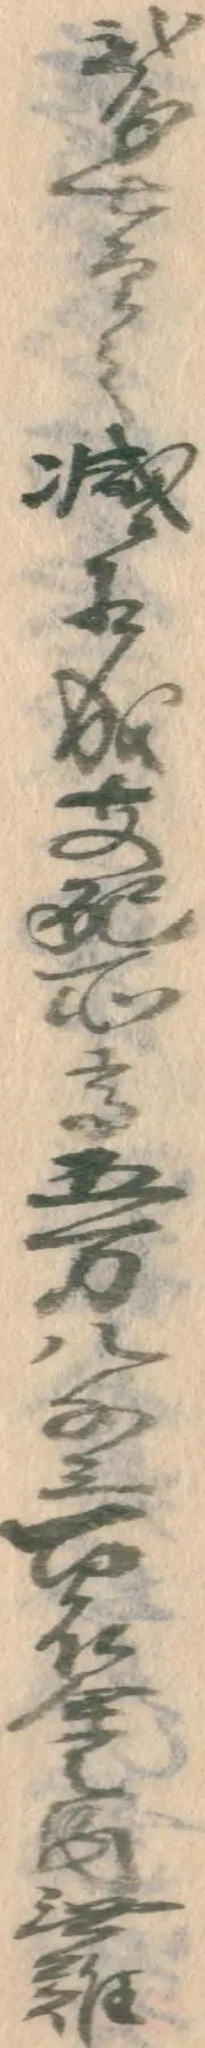弐歩七厘之減ニ相成支配所高五万八千三百石余之内無難
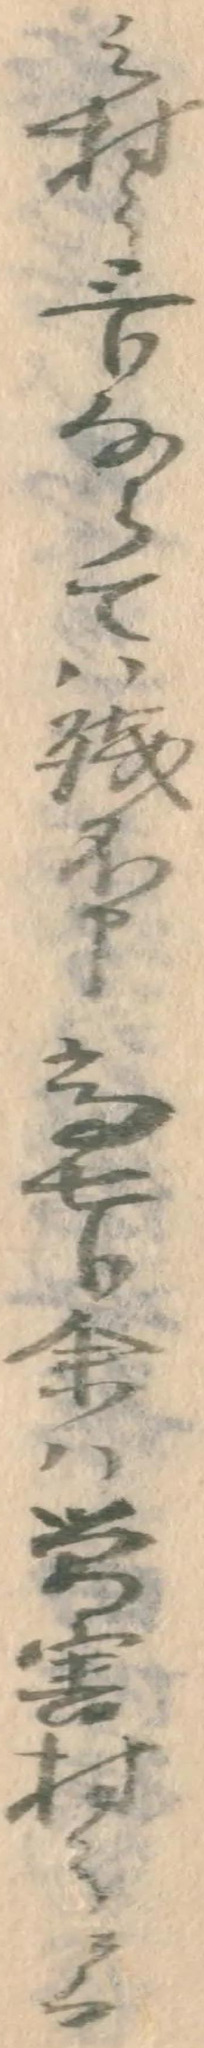之村々三分ならてハ残り不申高七分余ハ災害村々ニ而
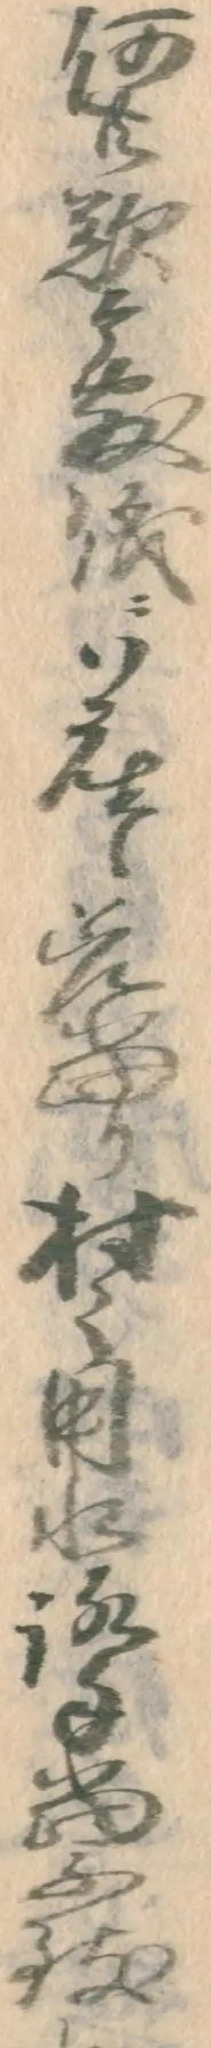何共歎敷義ニ御座候差当村々用水路手当不致候

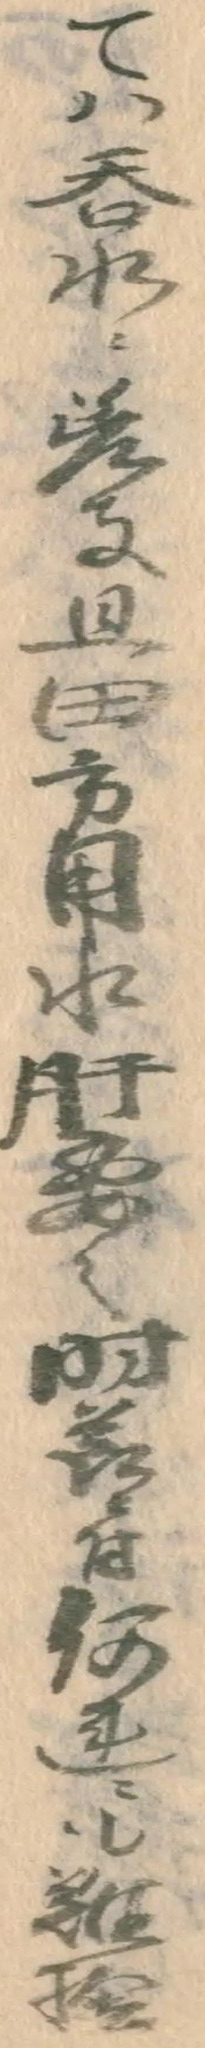てハ呑水ニ差支且田畑用水肝要之時節ニ付何れ二も難捨
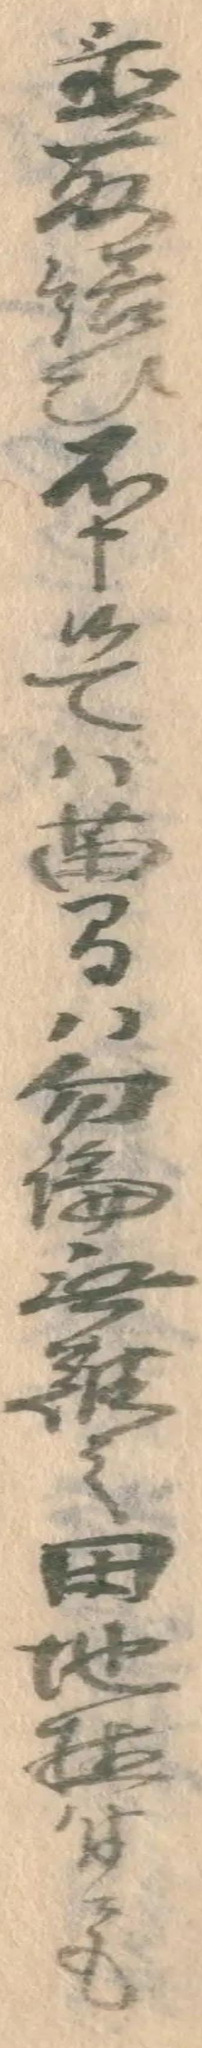置取繕ひ不申候てハ苗間ハ勿論無難之田畑植付ニも
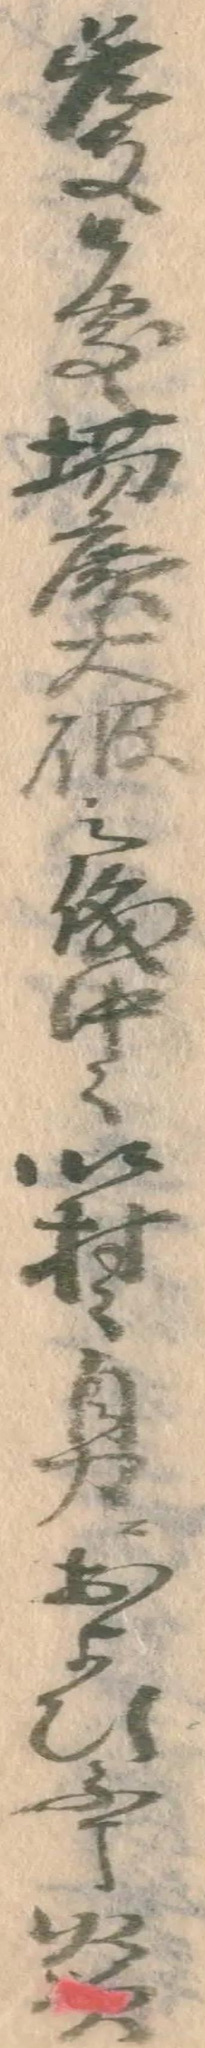差支候処場広大破之儀中々以及自力二およひ不申火災
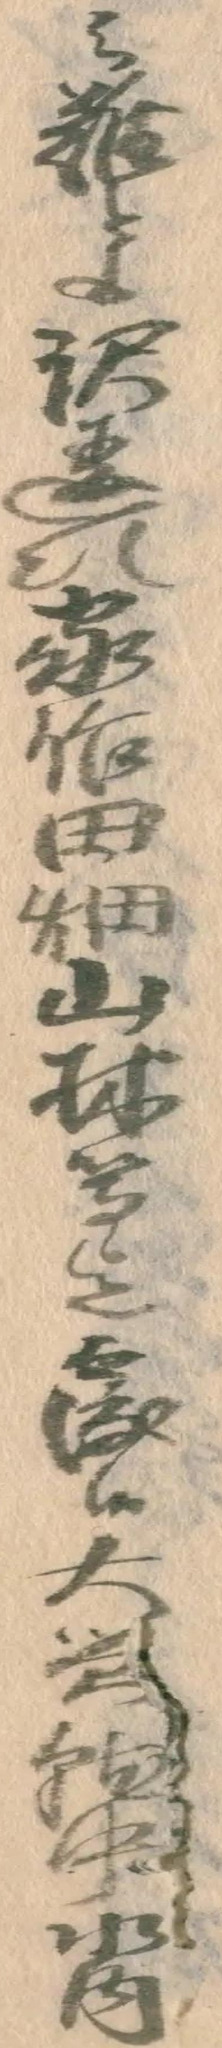之難とも訳違ひ家作田畑山林等迄覆候大災就中水内
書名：信州大地震之記
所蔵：国立国会図書館 National Diet Library, JAPAN
